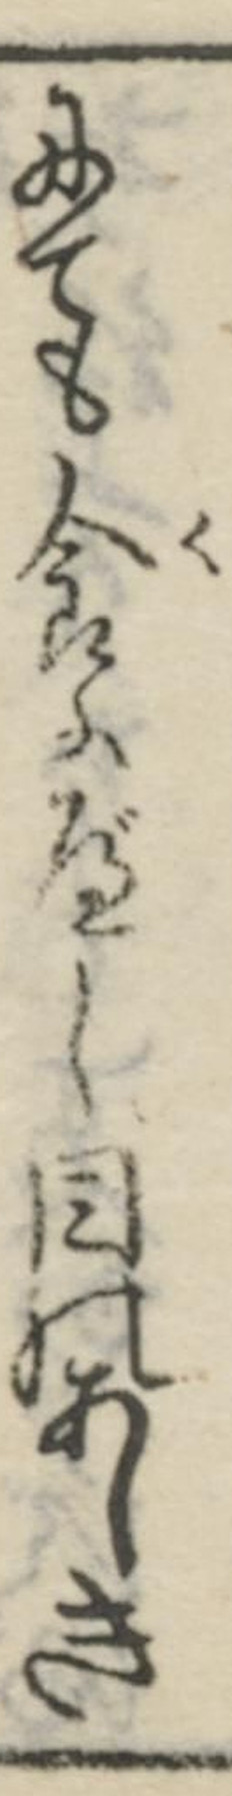にても食ふべし。目のあしき
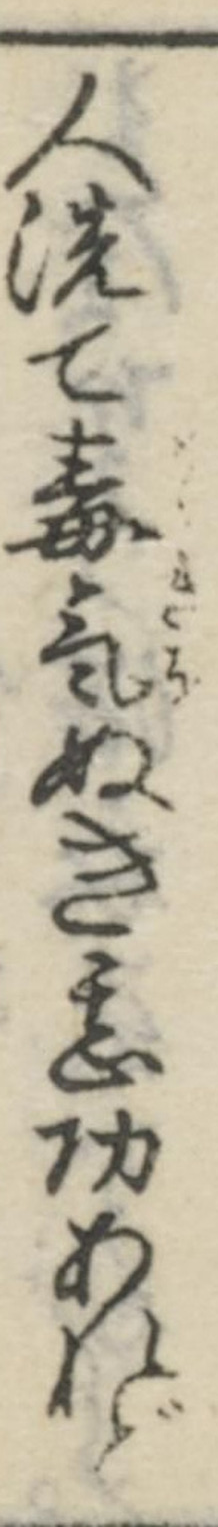人洗て毒気ぬき甚功あれど
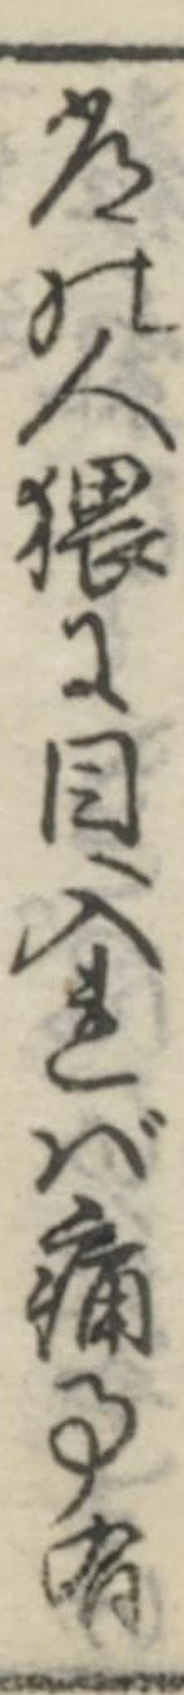常の人猥に目へ入れば痛事有
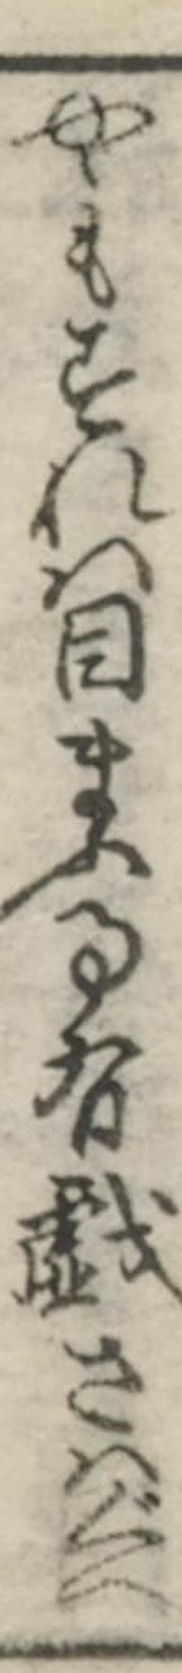やゝもすれは目まふ事有戯さはぐへ
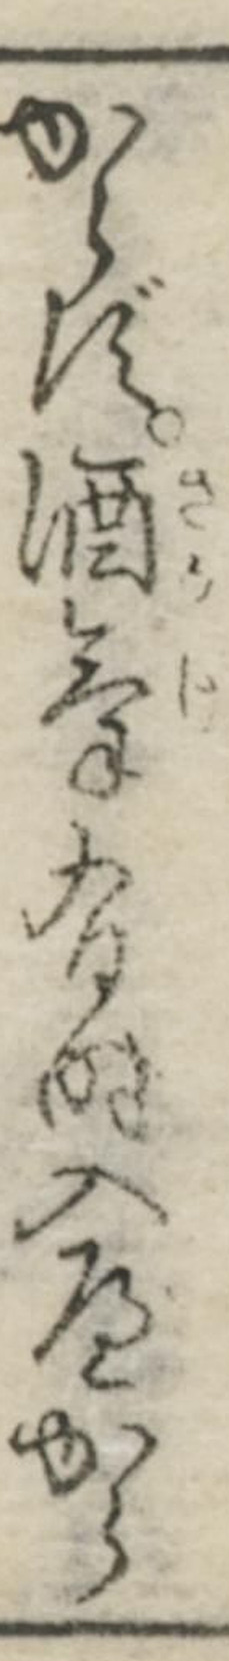からず。酒気有時入へから
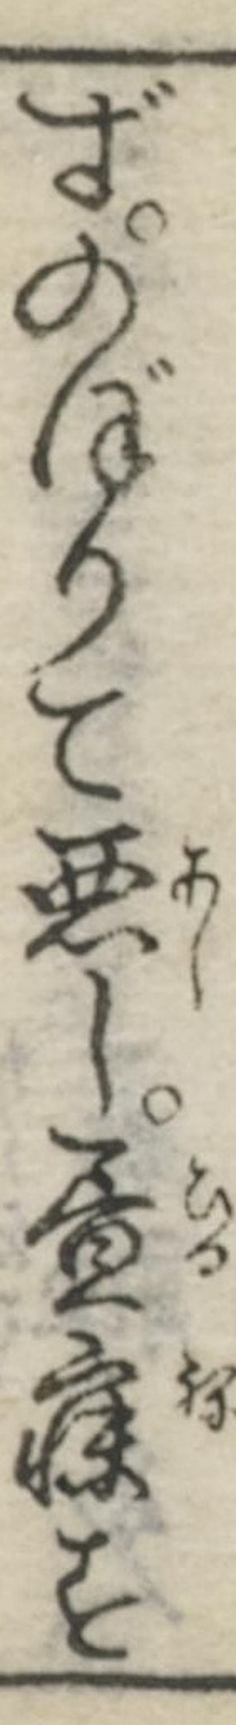ず。のぼりて悪し。昼寝す
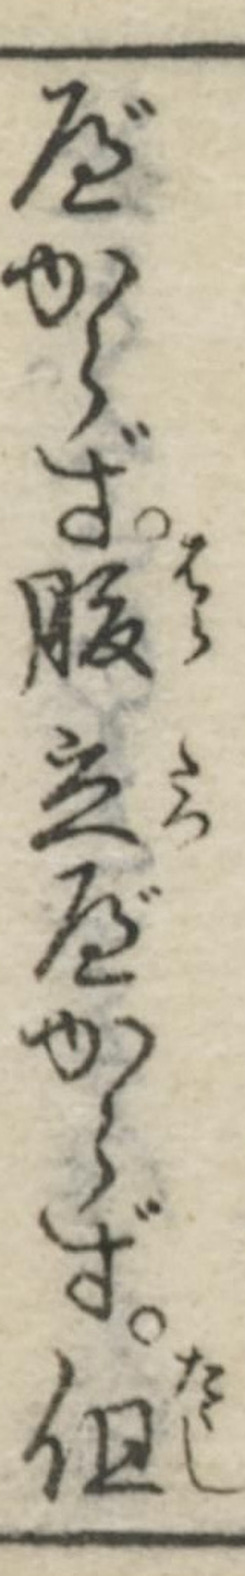べからず。腹立べからず。但
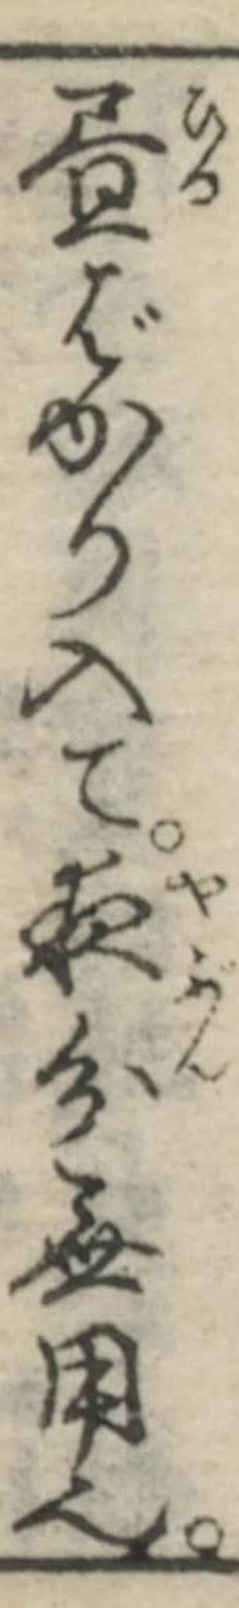昼ばかり入て。夜分無用也。

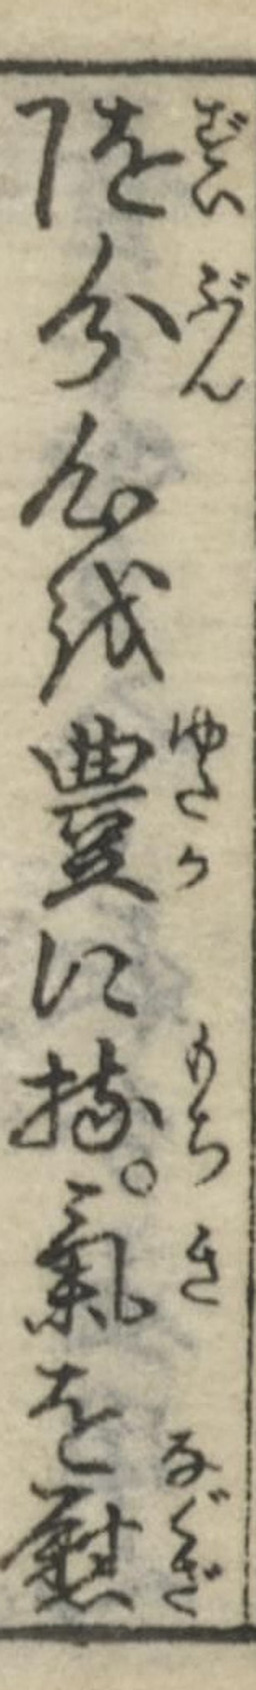随分心を豊に持。気を慰
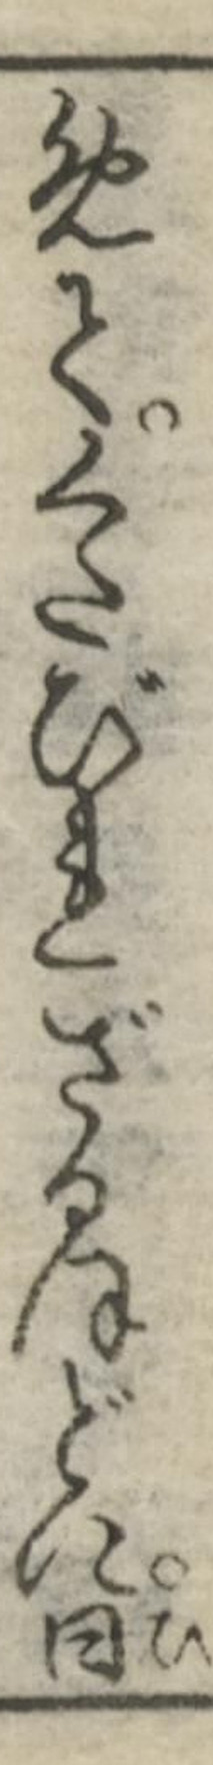めて。くたびれざるほどに。日
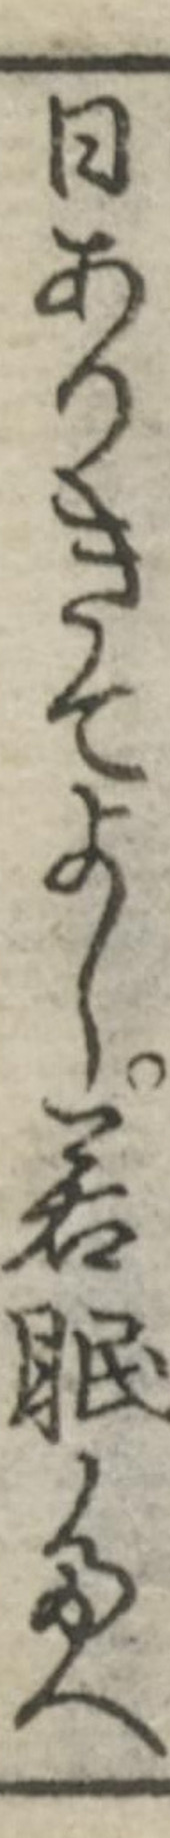日ありきてよし。若眠たへ
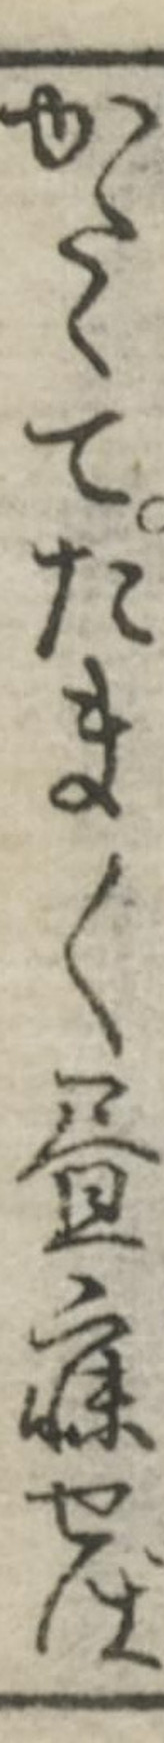がたくて。たま〳〵昼寝せば。
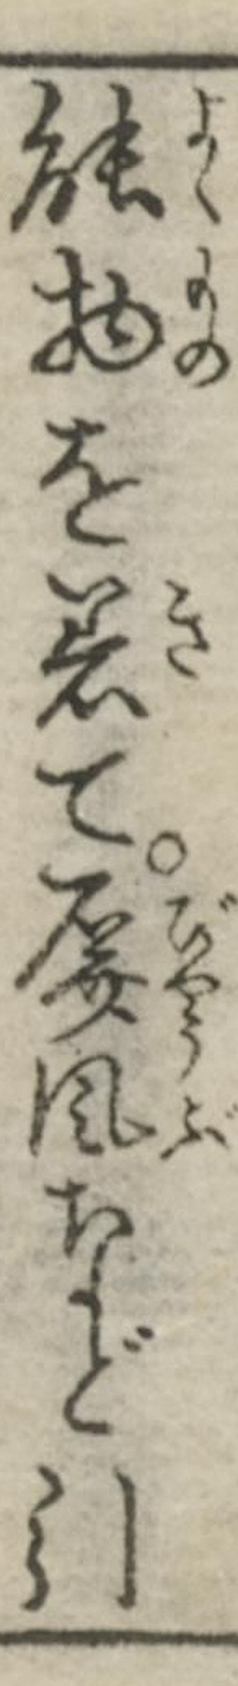能物を着て。屏風など引
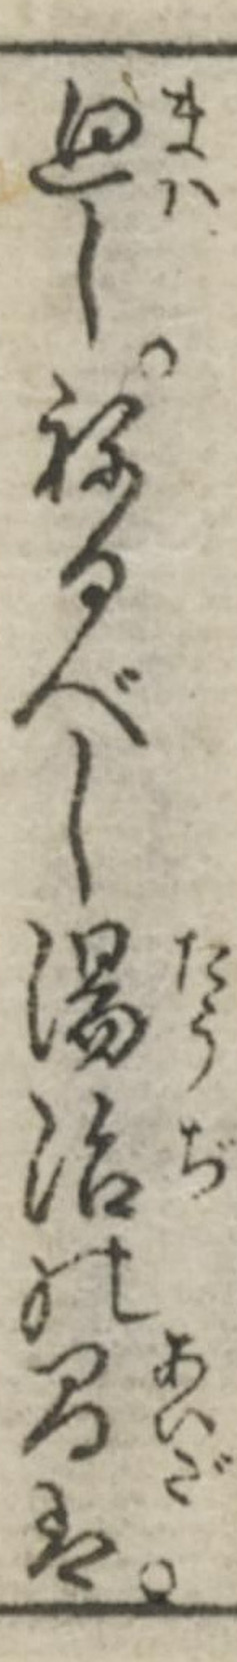廻し。ねるべし湯治の間は。
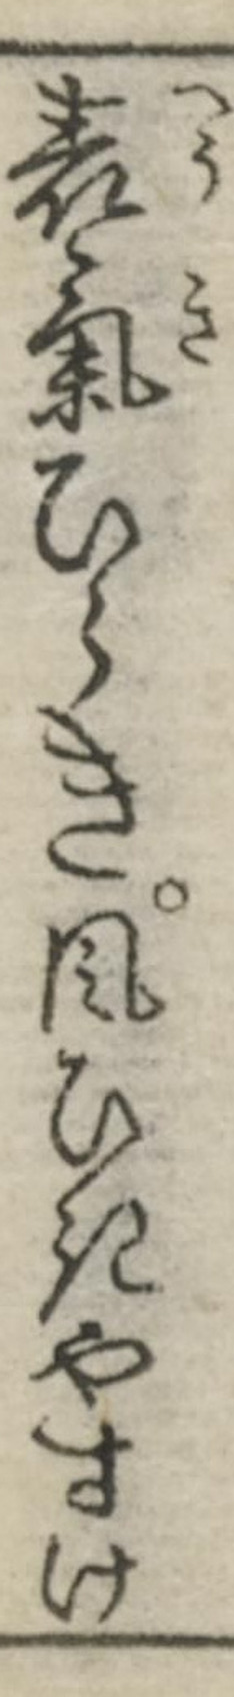表気ひらき。風ひきやすけ
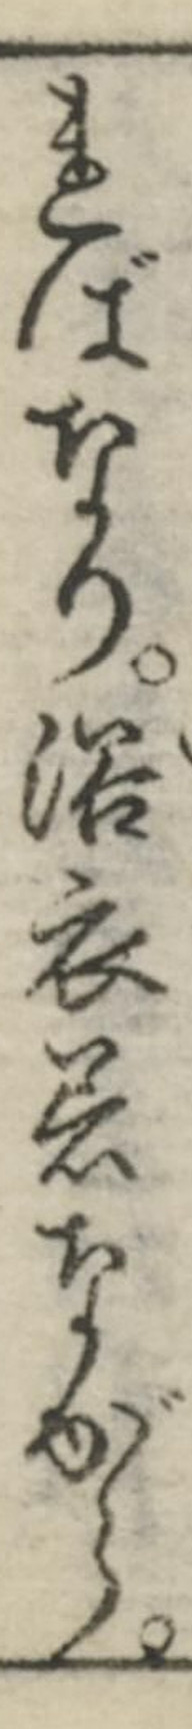ればなり。浴衣着ながら。
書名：但州城崎浴湯辧
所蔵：東京大学地震研究所図書室 Earthquake Research Institute Library, The University of Tokyo, JAPAN
